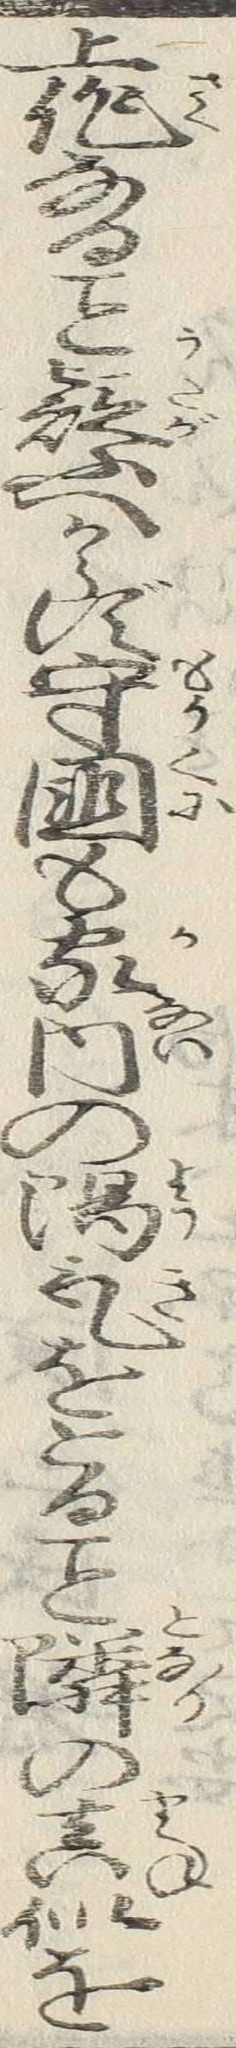上作なること疑ふへからず守国も家内の陽気をとること隣の真似を
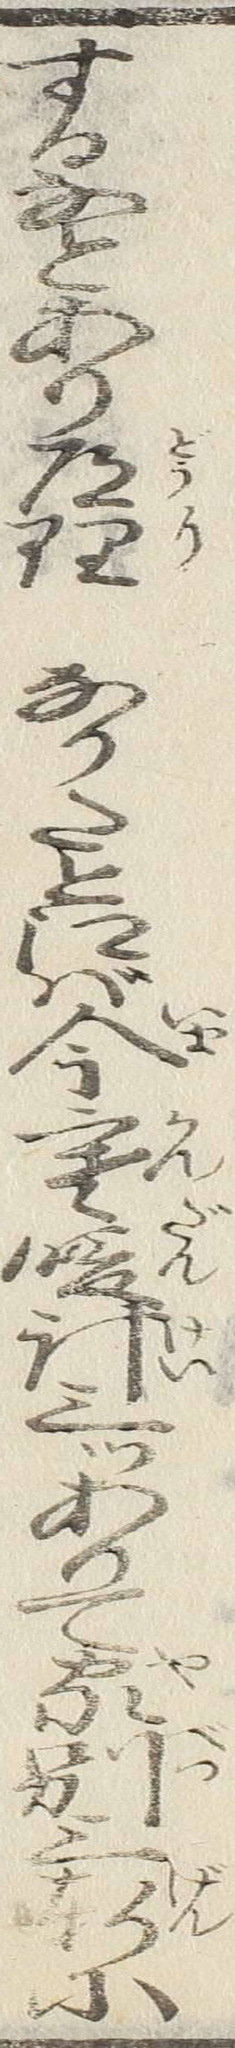するなとあり道理なりたとえば今寒暖計三ッありて家別三軒に
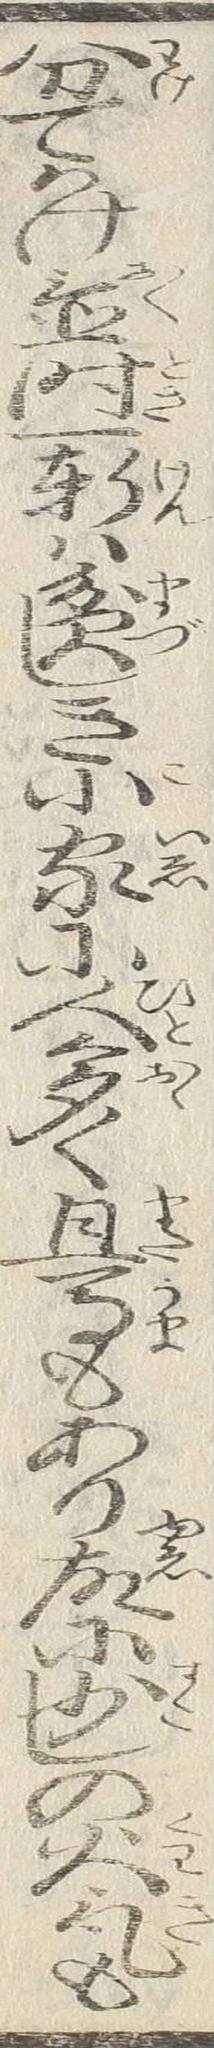分てかけ置時一軒は貧しき小家に人多く且馬もあり故に少しの火気も
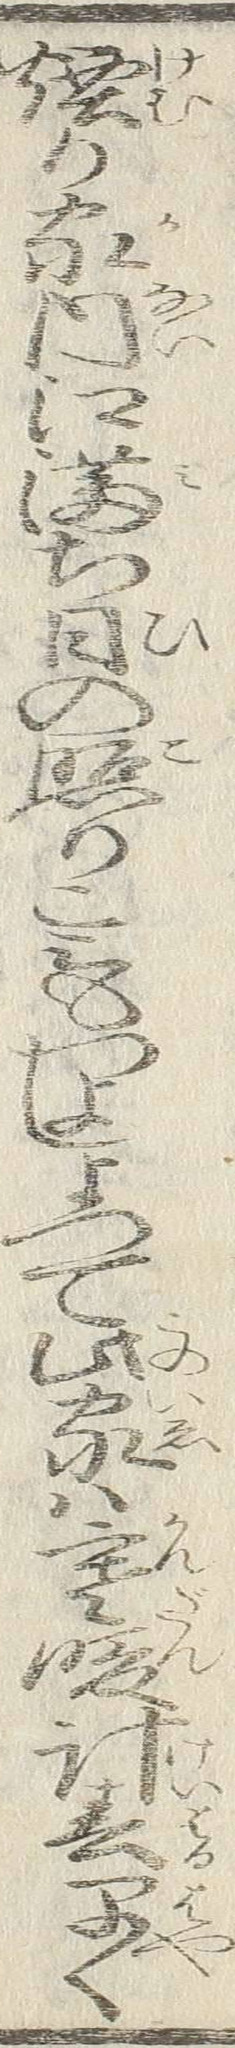煙り家内え満ち日の照りこみもつよしよつて此家は寒暖計春早く
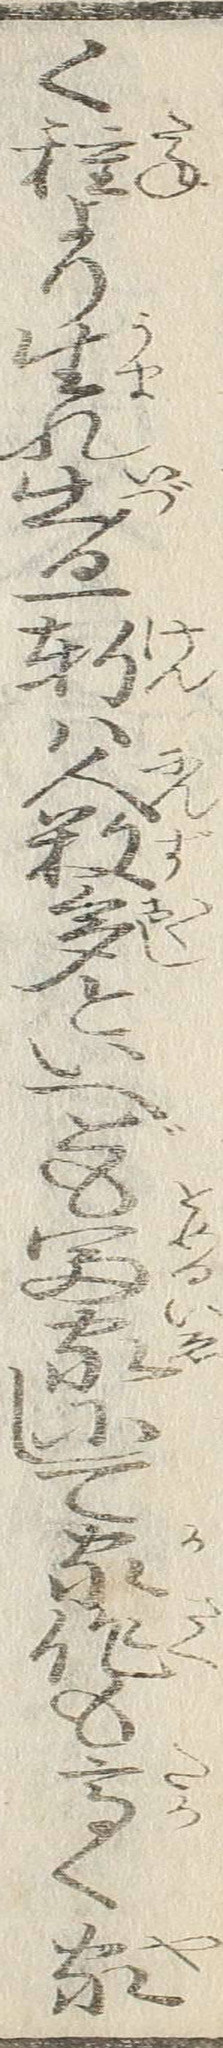く種より生れ出る一軒は人数多といへども冨家にして家作も高く家
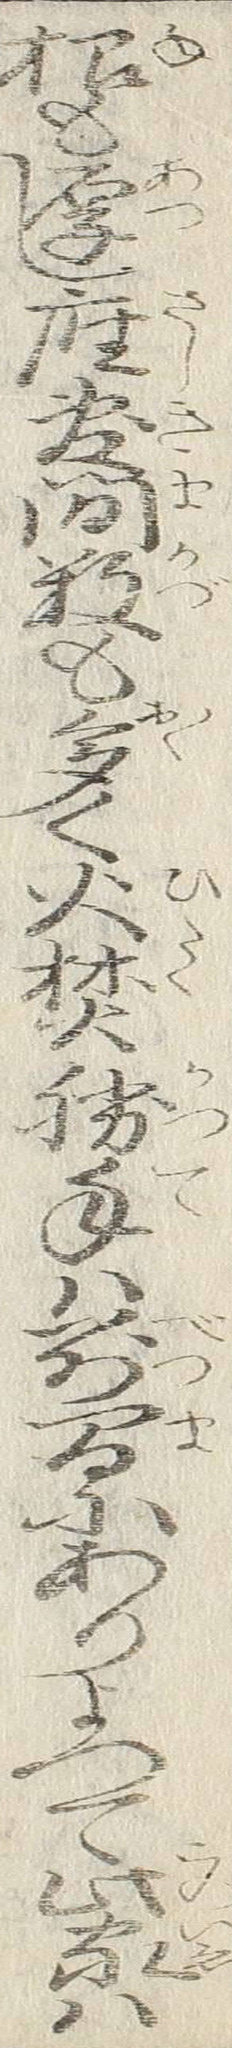根も厚し座敷間数も多く火焚勝手は別間にありよつて此家は
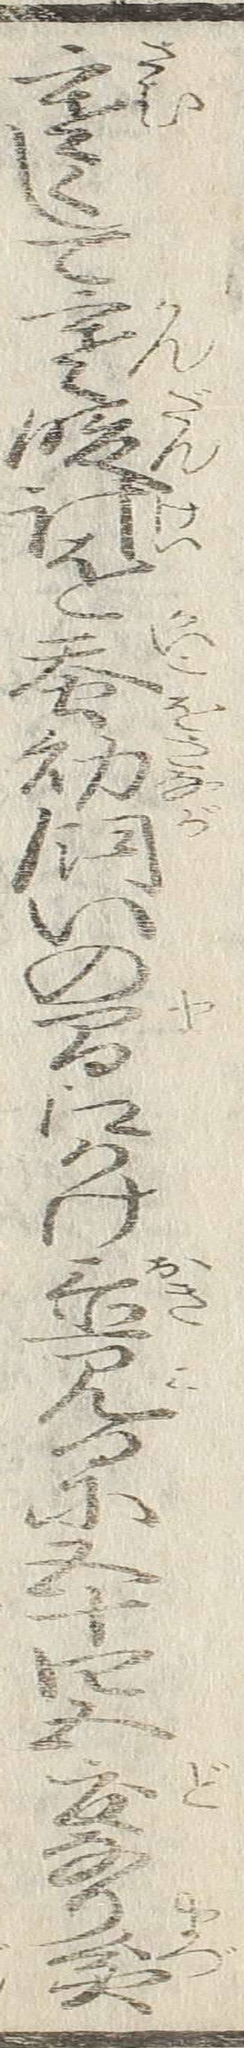寒くして寒暖計を蚕幼飼いの間えかけ置見るに五十四五度なり貧
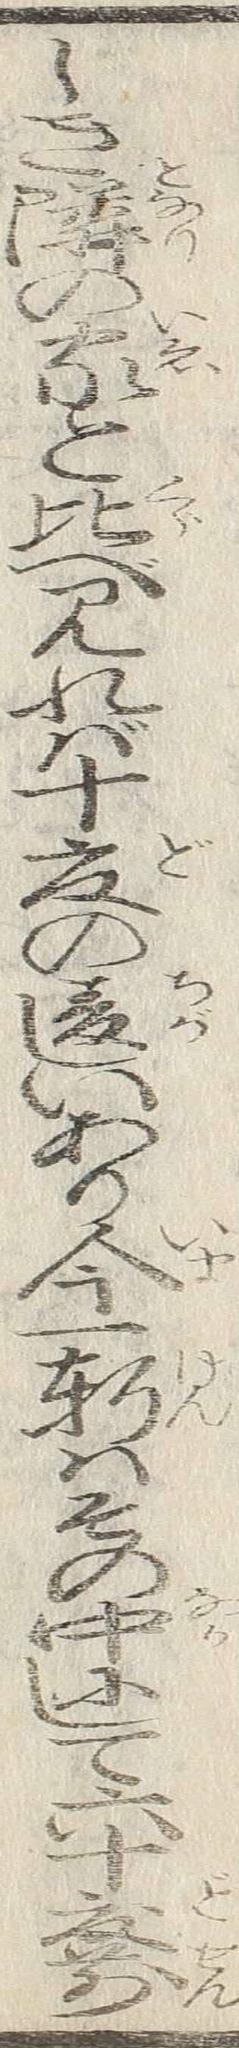しき隣の家と比べ見れば十度の違いあり今一軒はその中にして六十度前
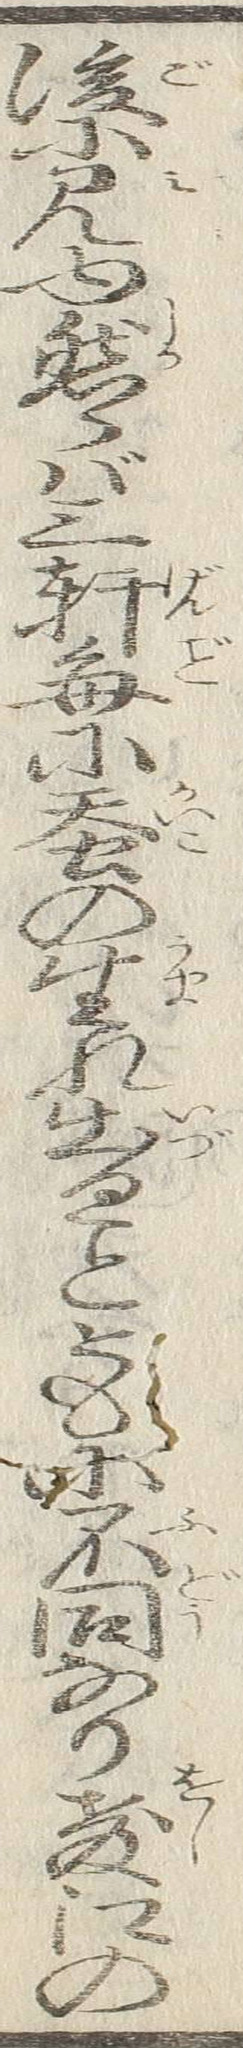後に見ゆ然らば三軒毎に蚕の生れ出ることともに不同なり教えの
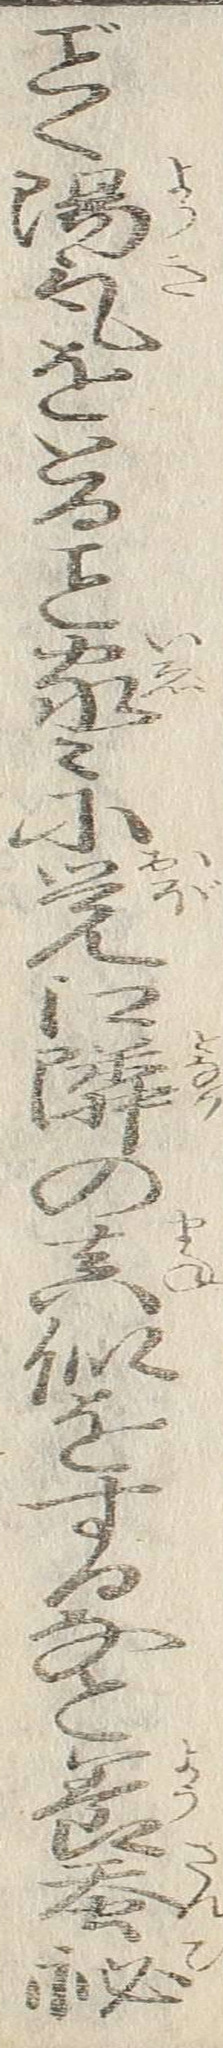ごとく陽気をとること家々に覚え隣の真似をするなと養蚕秘
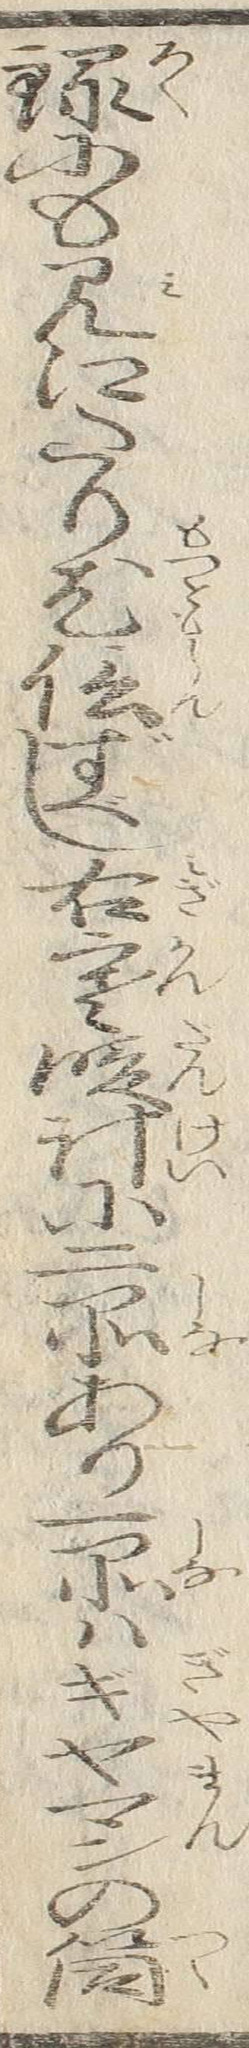録にも見えたり尤信ずべし右寒暖計に二品あり一品はギヤマンの筒

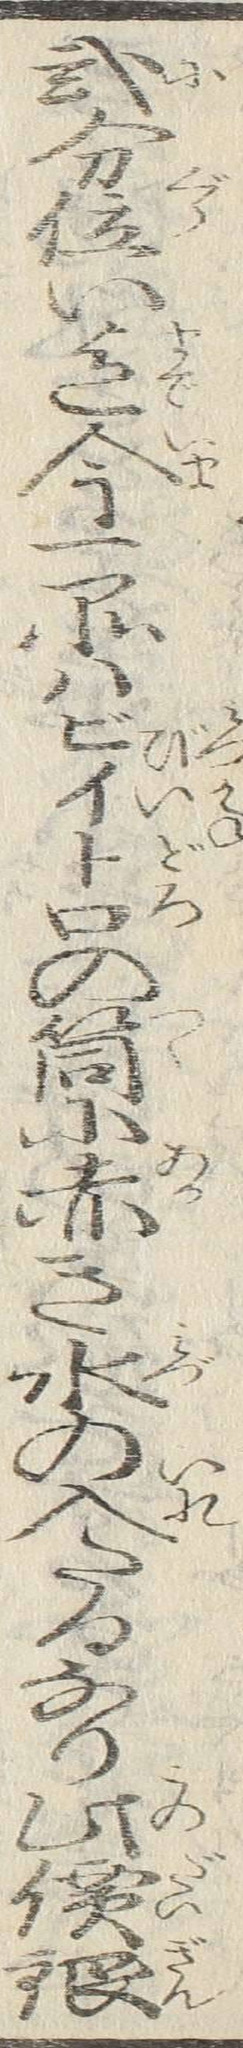弐分位い迄今一品はビイトロの筒に赤き水の入たるなり此價銀
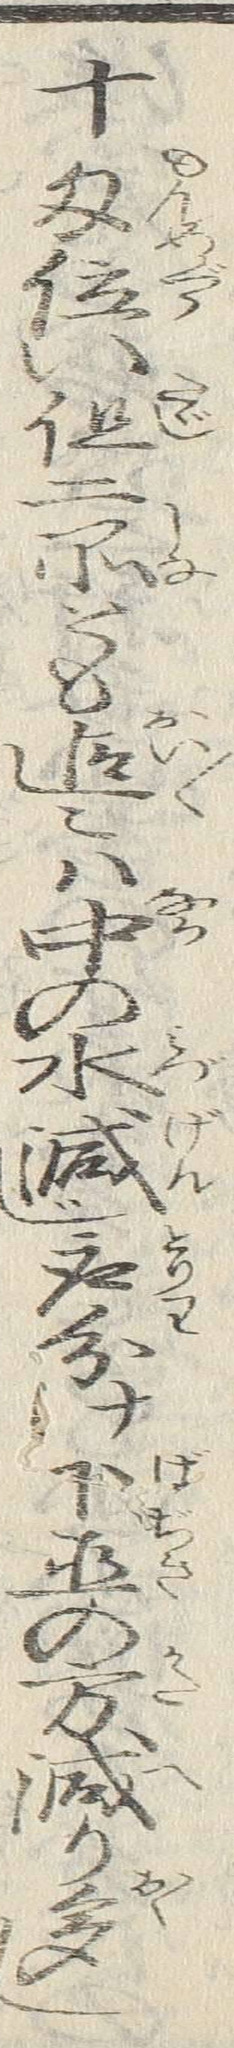十匁位い但二品とも追々は中の水減じ取分け下直の方減り多し
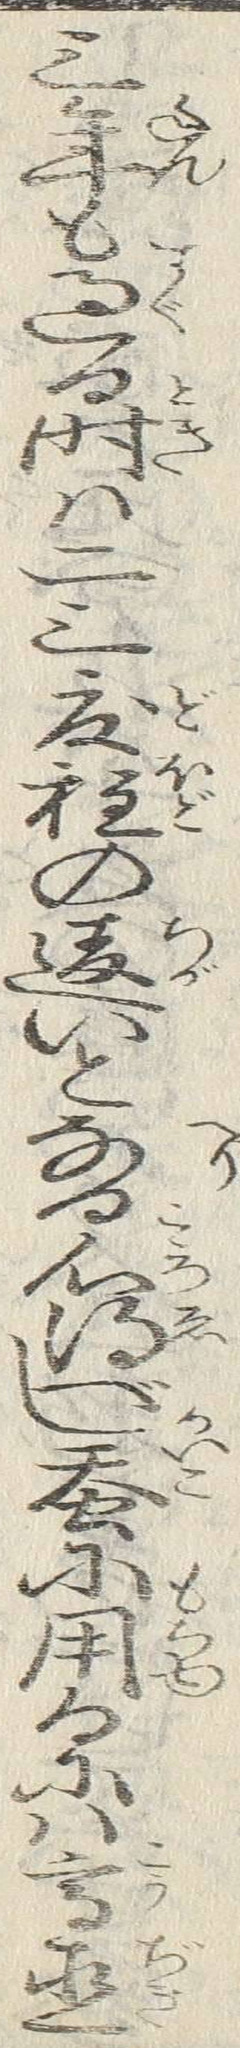三年も過る時は二三度程の違いとなる心得べし蚕に用るには高直
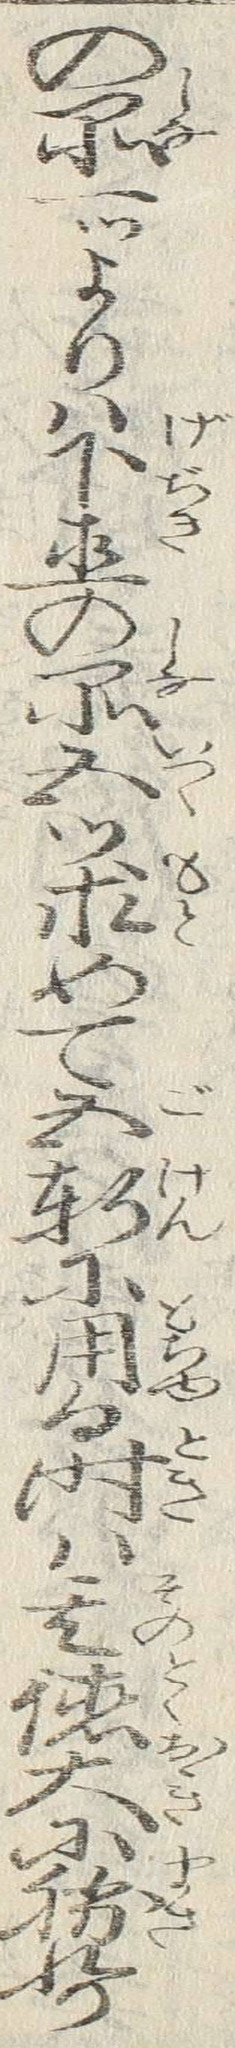の品一ッよりは下直の品五ッ求めて五軒に用る時は其徳大に勝れり
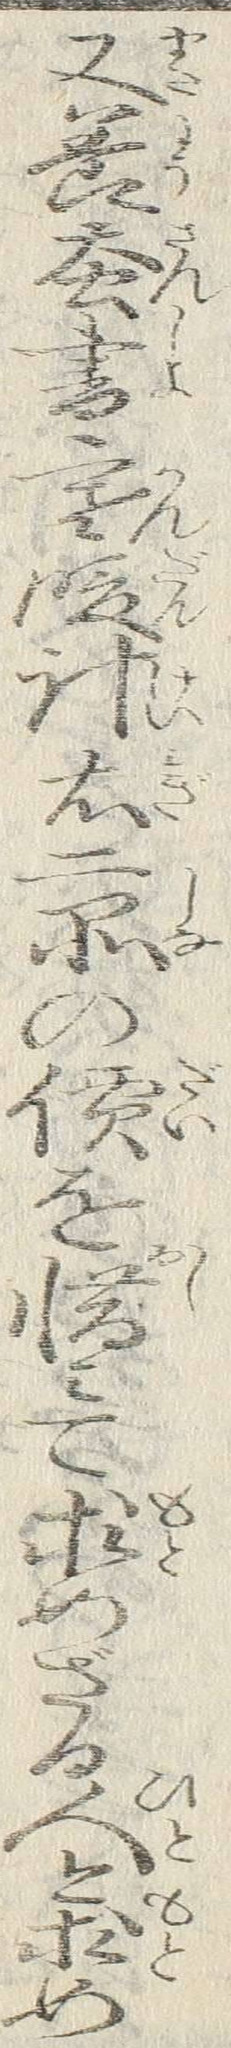又養蚕書寒暖計右二品の價を惜みて求めざる人と求め
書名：養蠶實驗録
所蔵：東京大学農学生命科学図書館 国文学研究資料館
